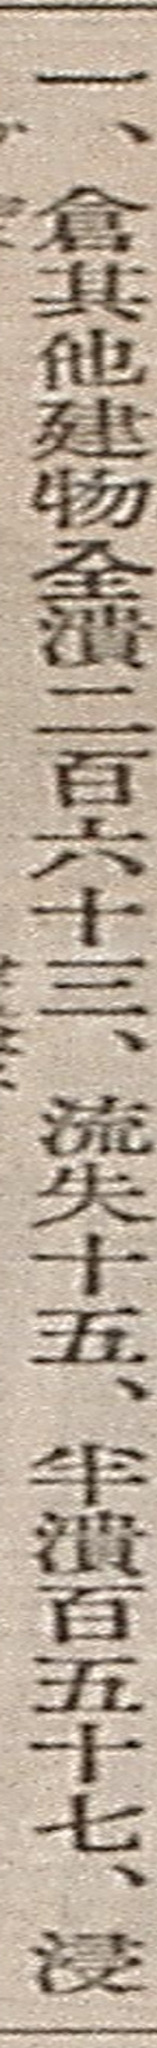一、倉其他建物全潰二百六十三、流失十五、半潰百五十七、浸
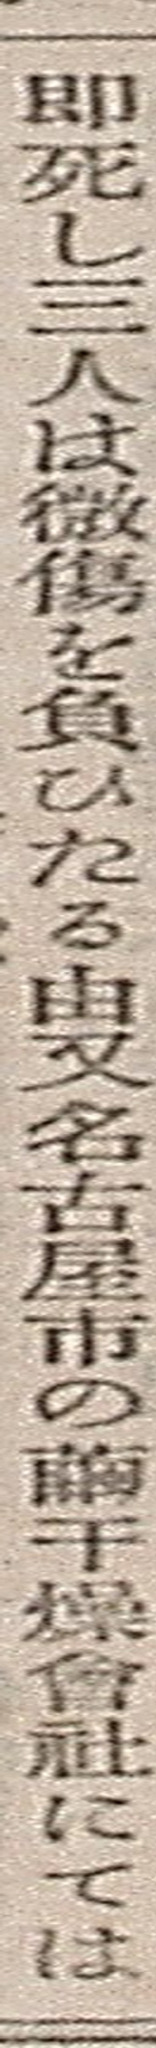即死し三人は微傷を負ひたる由又名古屋市の繭干燥會社にては
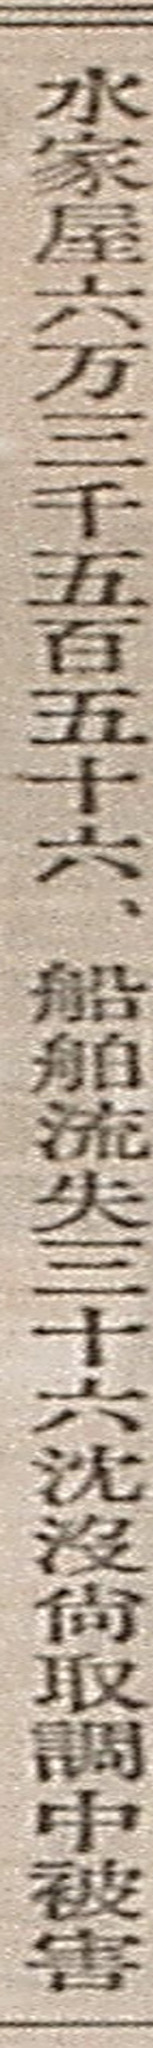水家屋六万三千五百五十六、船舶流失三十六沈没尚取調中被害
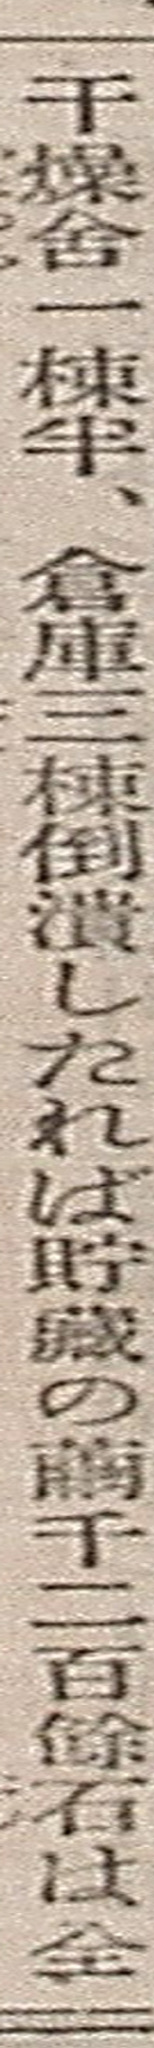干燥舎一棟半、倉庫三棟倒潰したれば貯蔵の繭千二百餘石は全
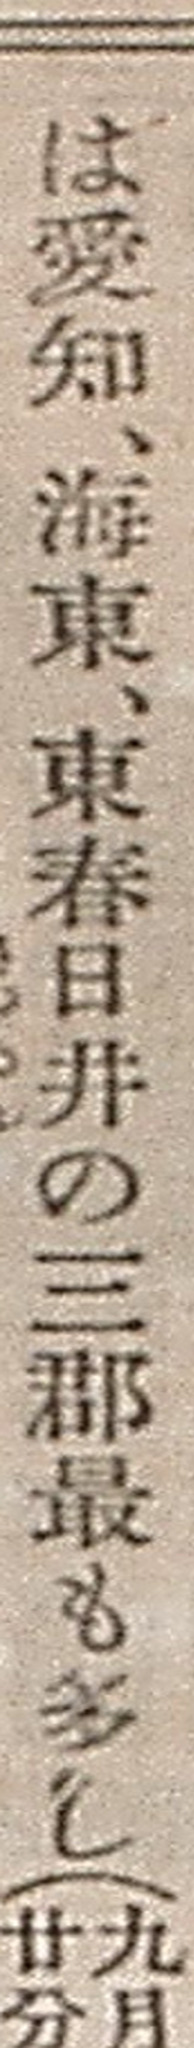は愛知、海東、東春日井の三郡最も多し
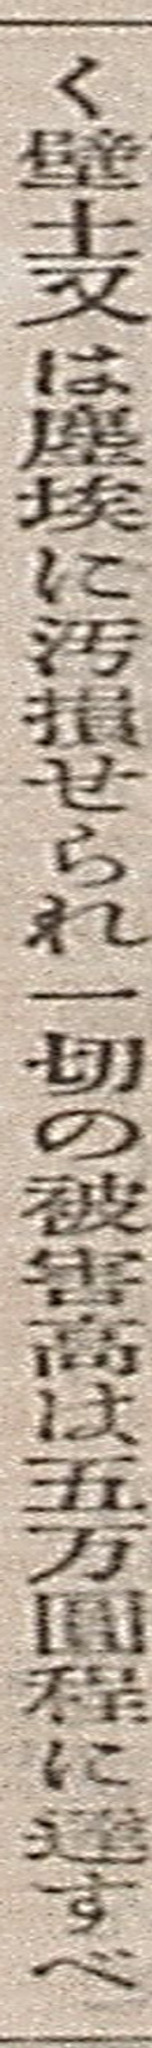く壁土又は塵埃に汚損せられ一切の被害高は五万円程に達すべ
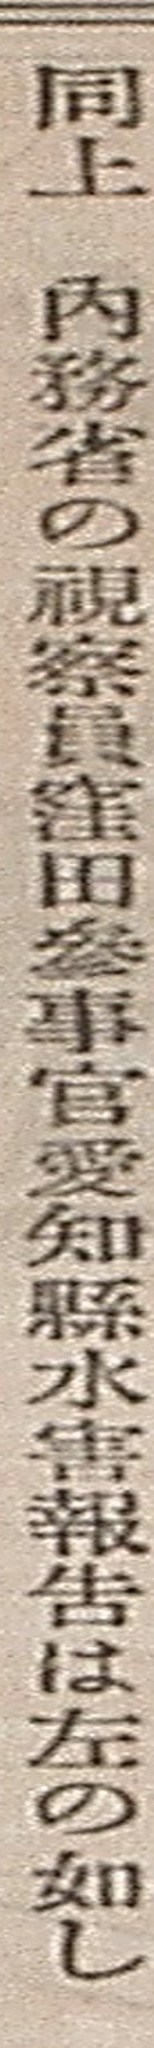同上、内務省の視察員窪田参事官愛知県水害報告は左之如し
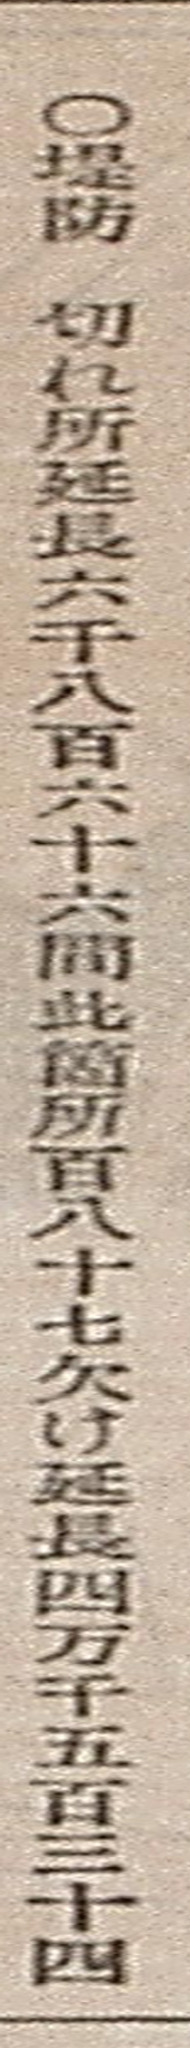◯堤防切れ所延長六千八百六十六間此箇所百八十七欠け延長四万千五百三十四
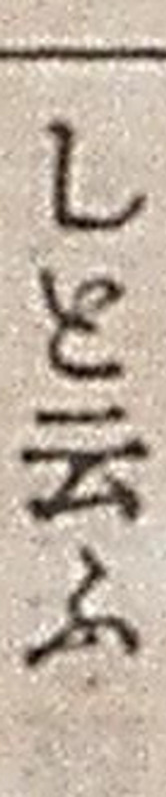しと言ふ
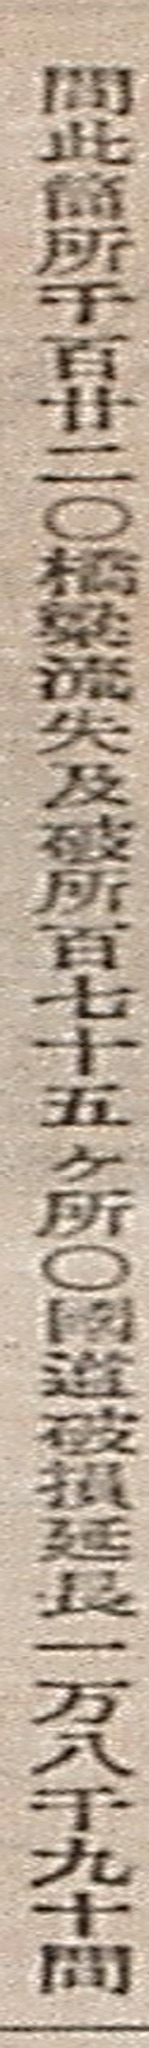間此箇所千百廿二◯橋梁流失及破所百七十五ヶ所◯国道破損延長一万八千九十間
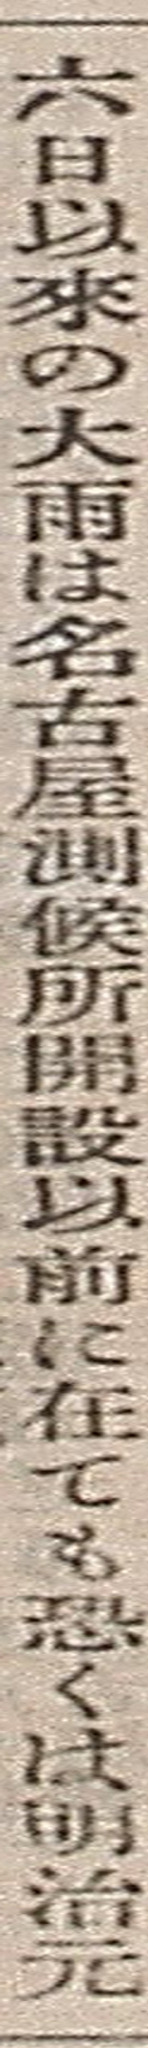六日以来の大雨は名古屋測候所開設以前に在ても恐くは明治元
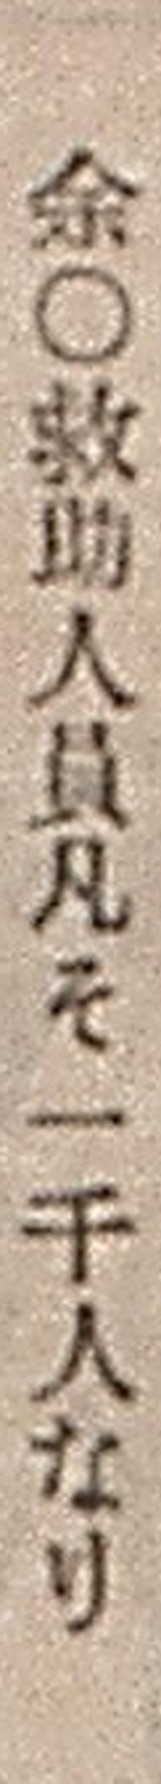余◯救助人員凡そ一千人なり
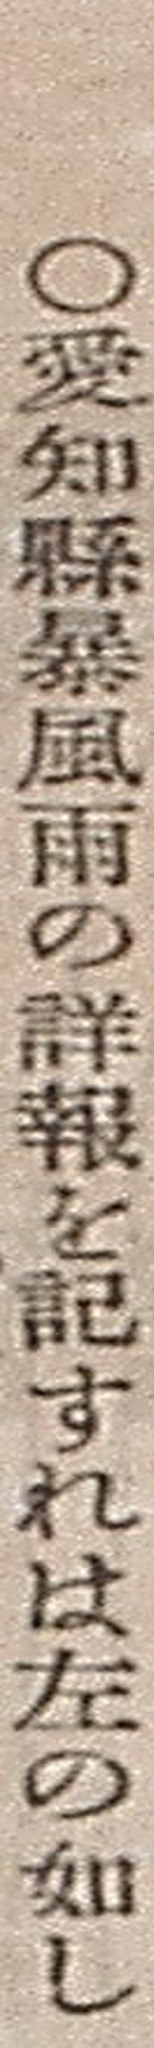◯愛知県暴風雨の詳報を記すれば左の如し
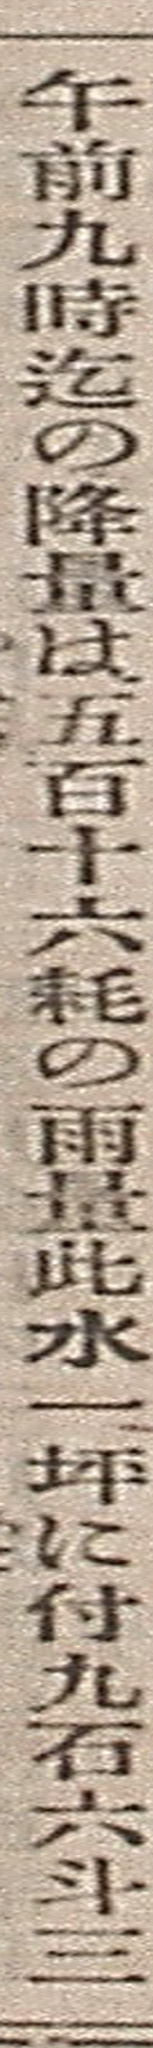午前九時迄の降量は五百十六粍の雨量此水一坪に付九石六斗三
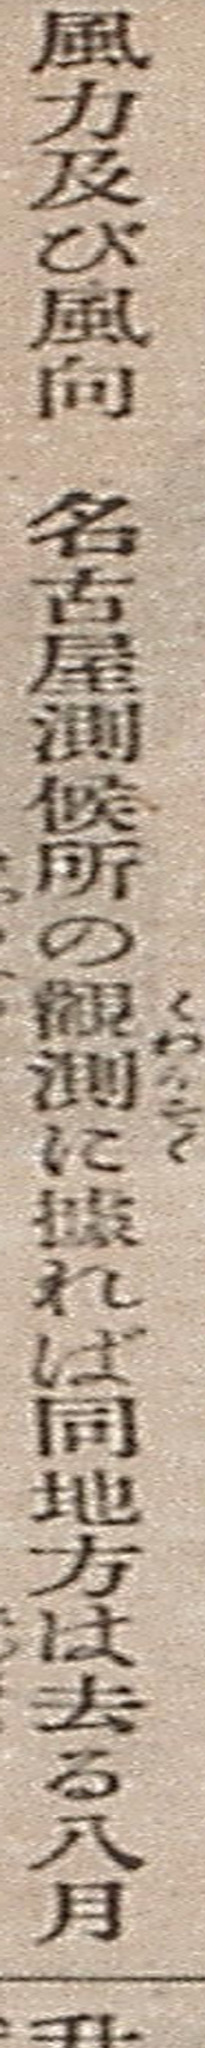風力及び風向名古屋測候所の観測に拠れば同地方は去る八月
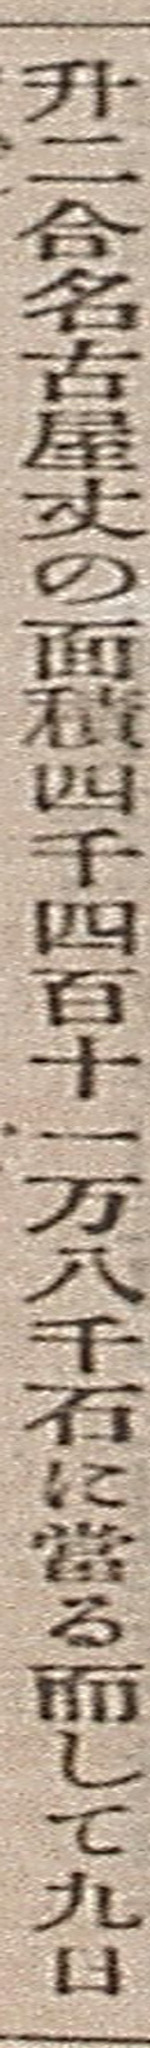升二合名古屋丈の面積四千四百十一万八千石に当る而して九日
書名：風俗畫報臨時増刊第百二十六號　洪水被害録（中）
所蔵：東京大学地震研究所図書室 Earthquake Research Institute Library, The University of Tokyo, JAPAN
